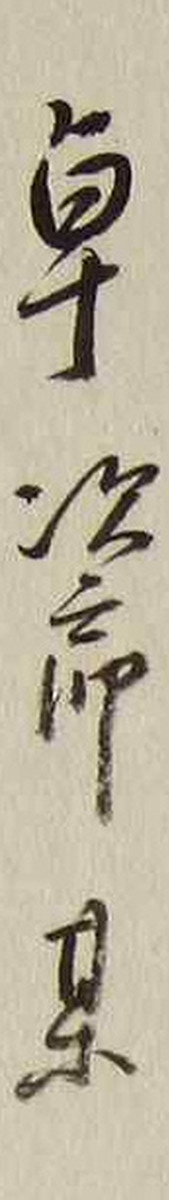卓次郎某
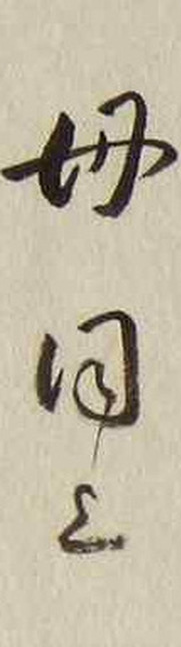母同上

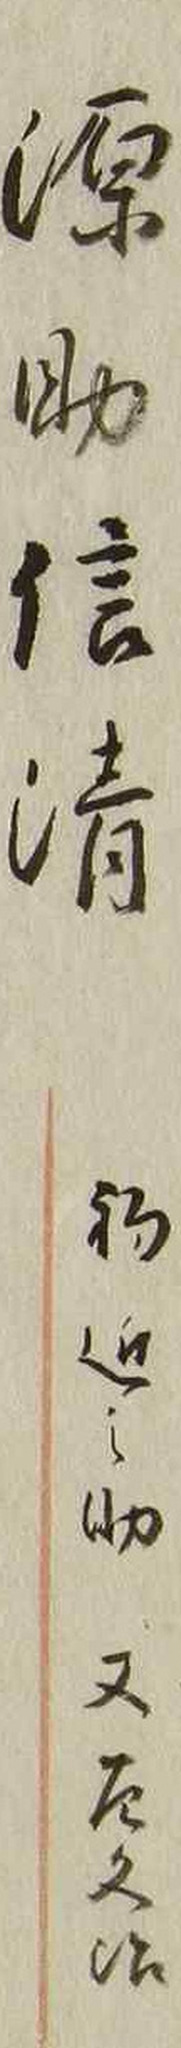源助信清初近之助又左久治
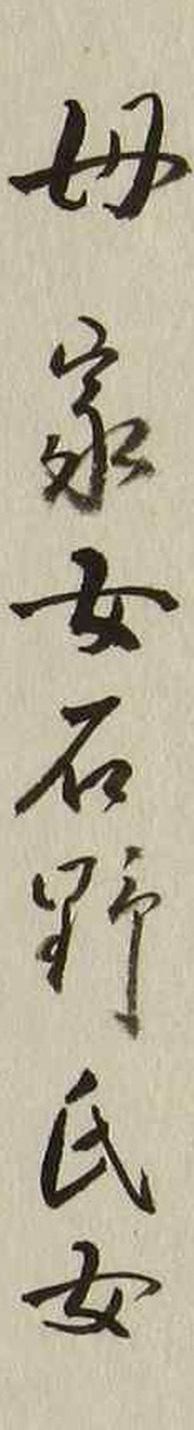母家女石野氏女
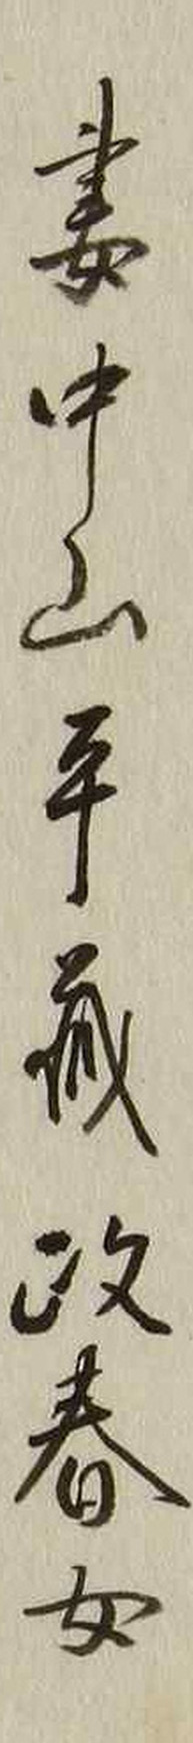妻中山平蔵政春女
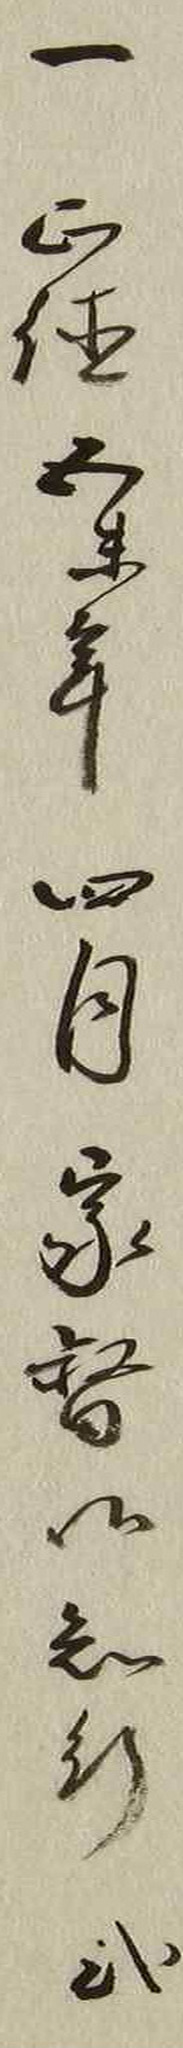一正徳五未年四月家督御知行弐
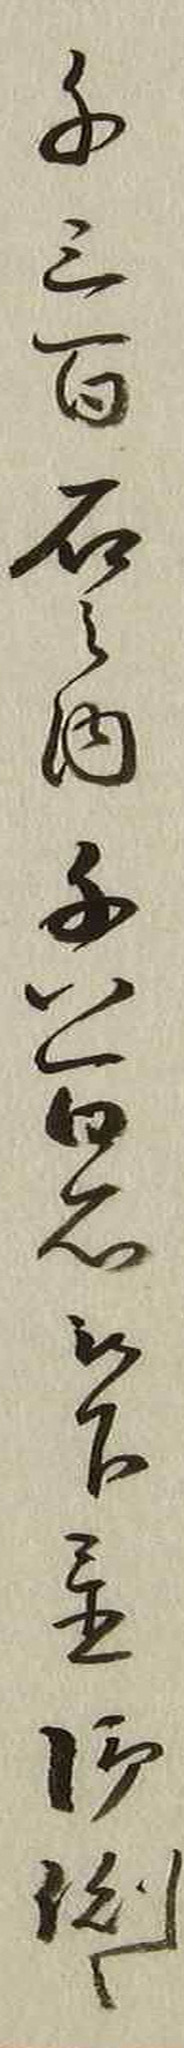千三百石之内千八百石被下置御側之
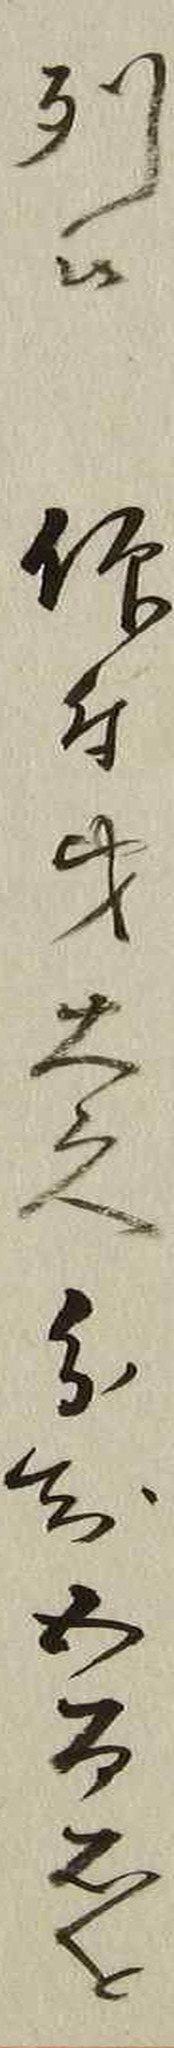列被仰付弟大久分知五百石を
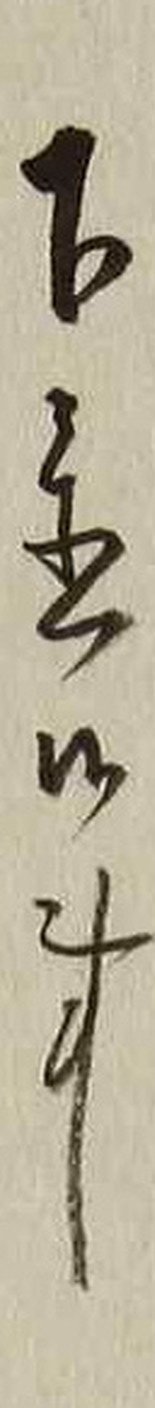下置候事
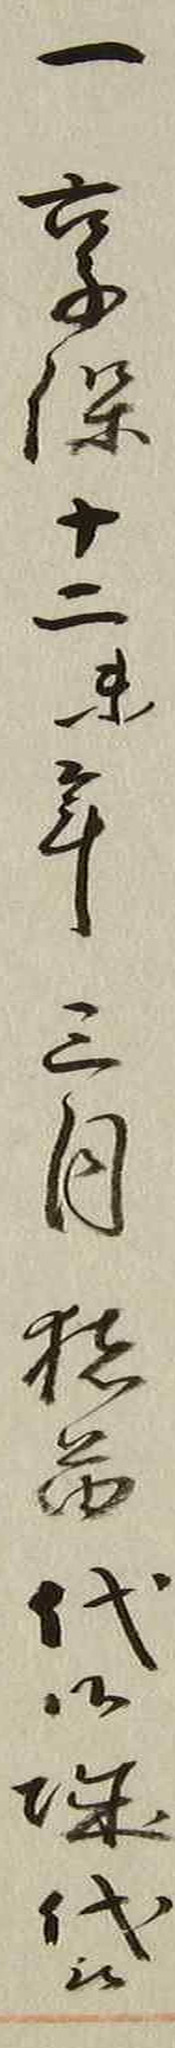一享保十二未年三月猪苗代御城代被
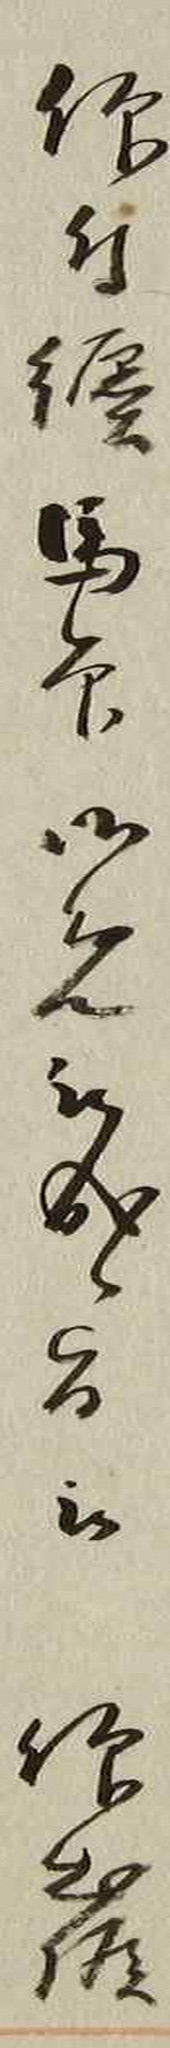仰付纏馬印御免被成候旨被仰出候
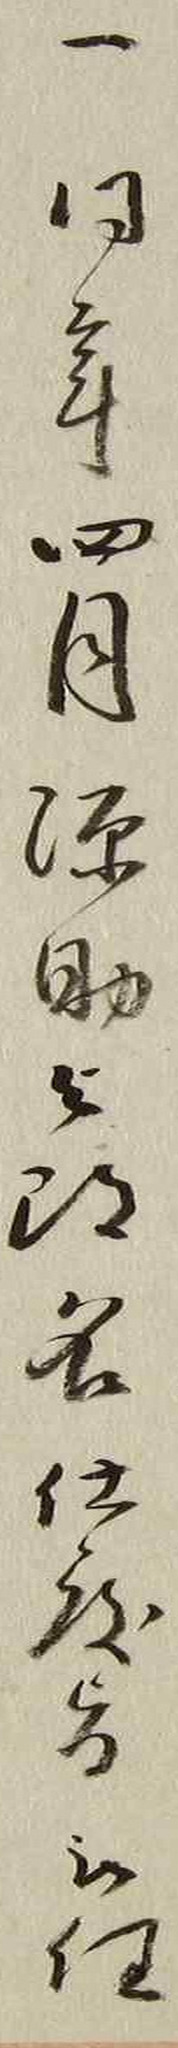一同年四月源助と改名仕度旨被任
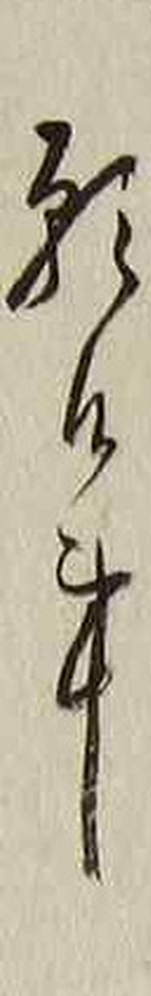願候事
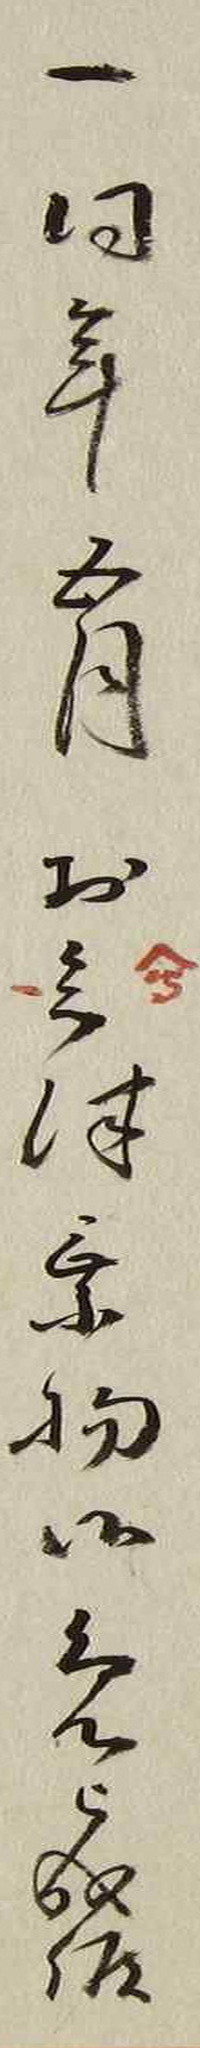一同年五月於会津乗物御免成候
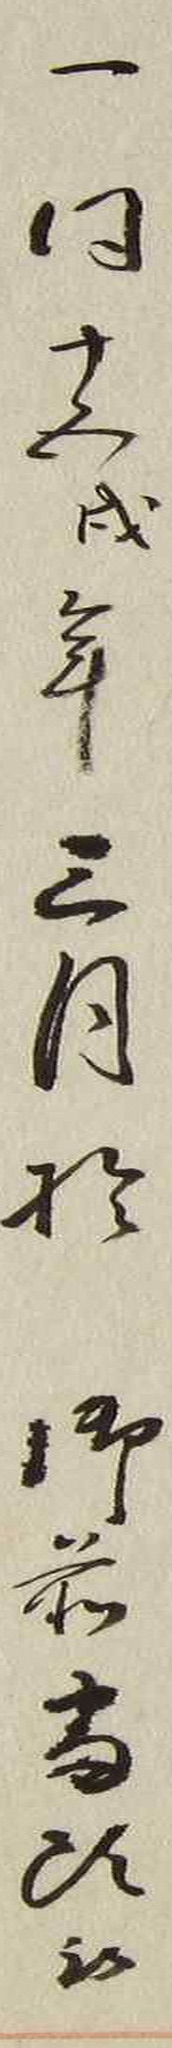一同十五戌年三月於御前番頭被
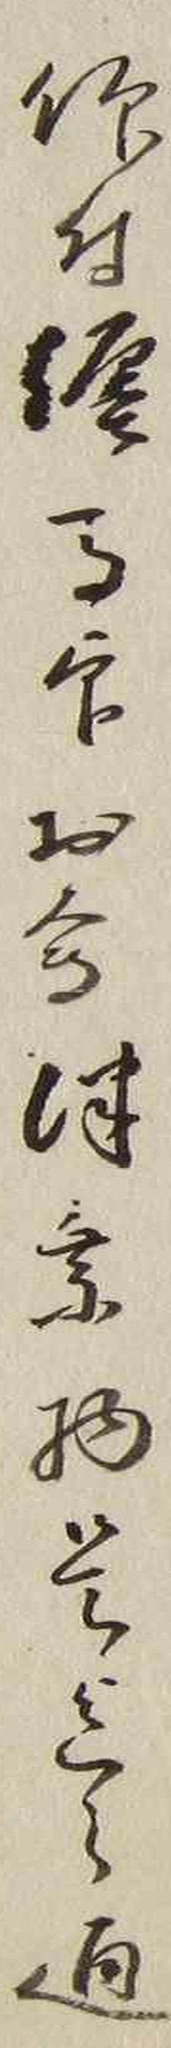仰付纏馬印於会津乗物是迄之通
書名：諸士系譜　巻之159　な之部1
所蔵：会津若松市立会津図書館
